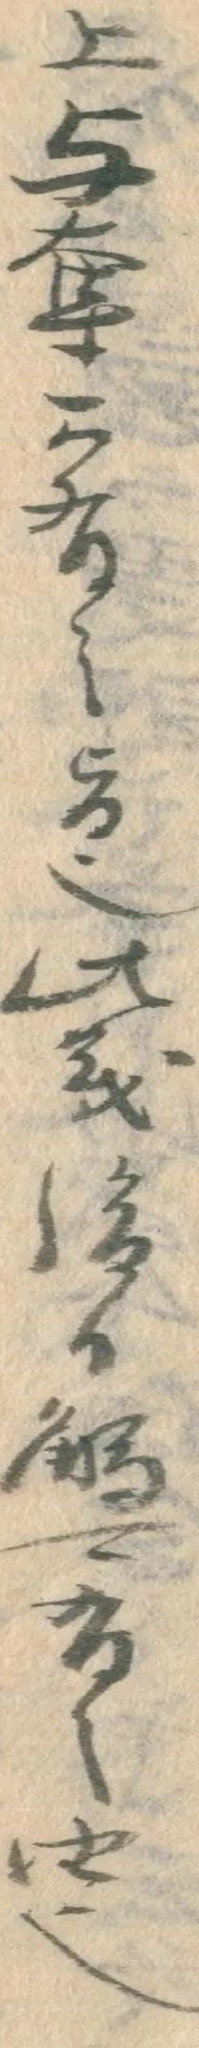上与奪可有之旨也、此義、後日触可有と由也、
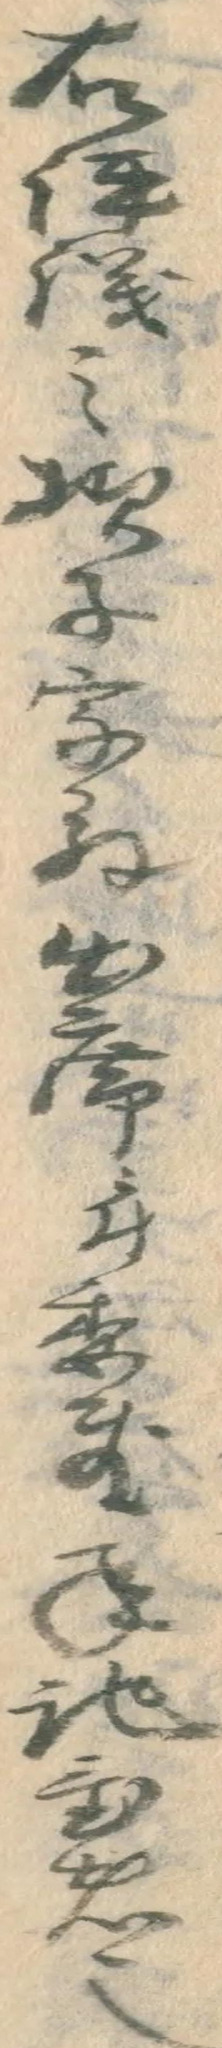右評議之様子、家翁出席ニ付、委敷承記置者也、

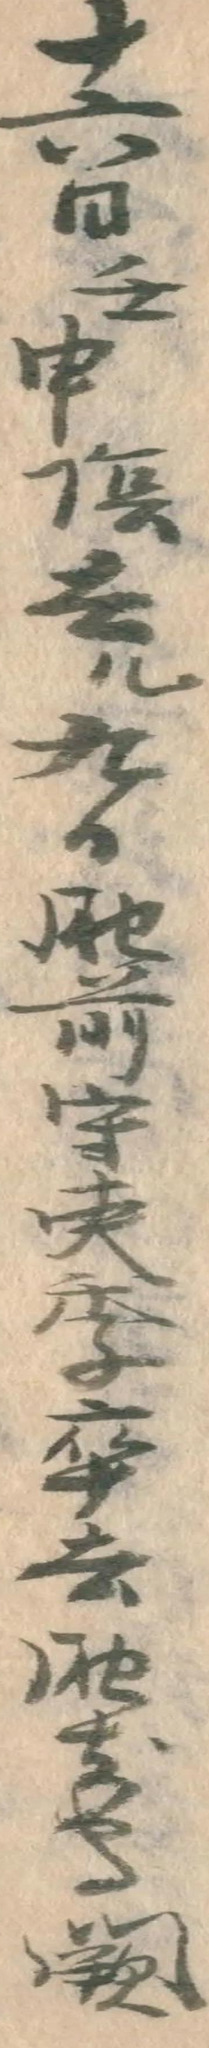十六日壬申陰、去ル九日肥前守吏季卒去、肥前守闕
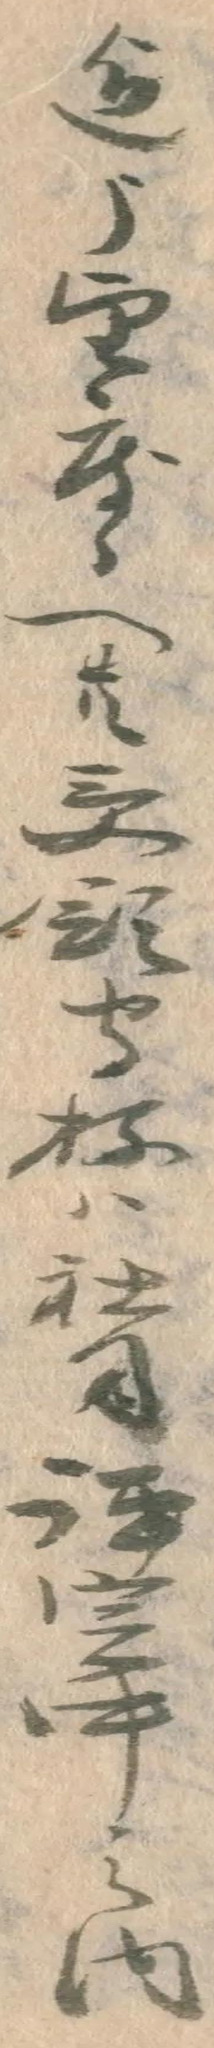迄申望候へ共、受預守称ハ社司・評定中之内
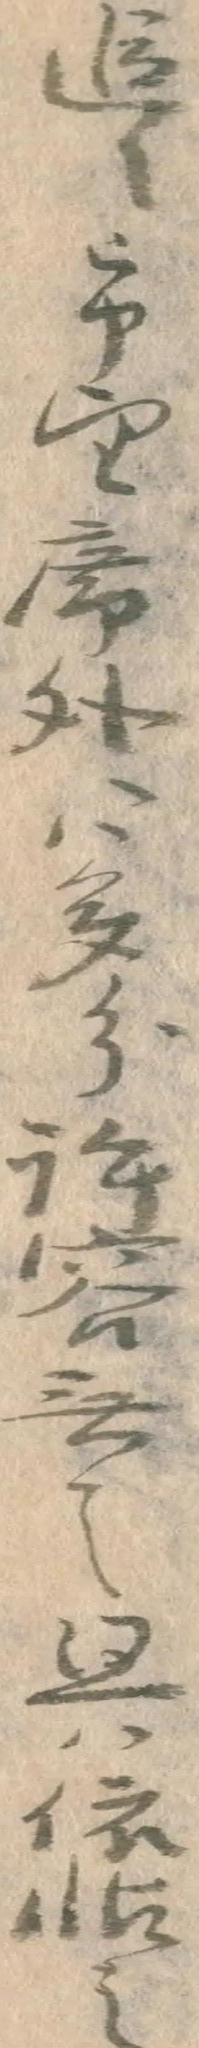追々被申望、席外ヘハ多分許容無之、且ハ依怙之
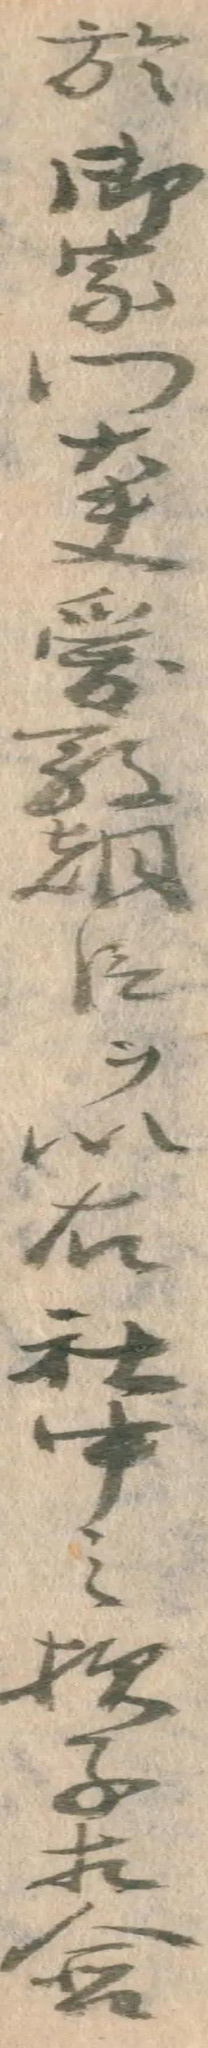於御家門大夫受領朝臣ヲ以、右社中之様子相含、
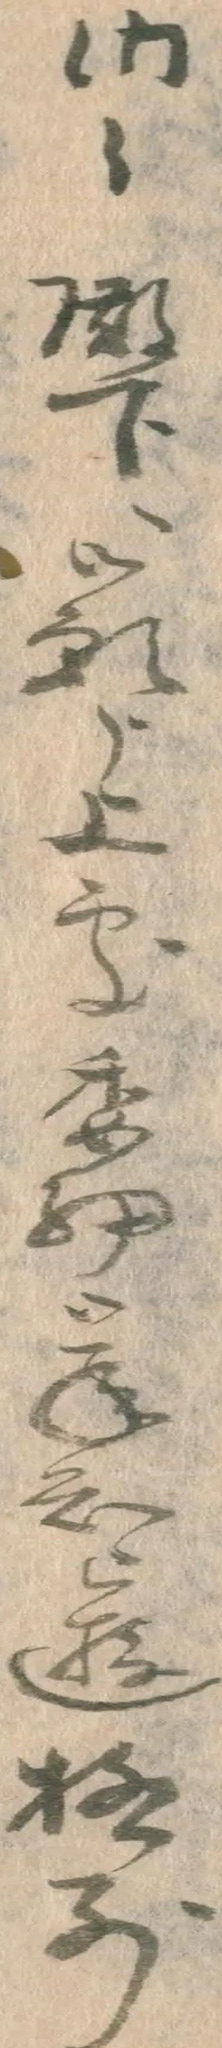内々殿下へ御願申上處、委細御承知被遊、格別
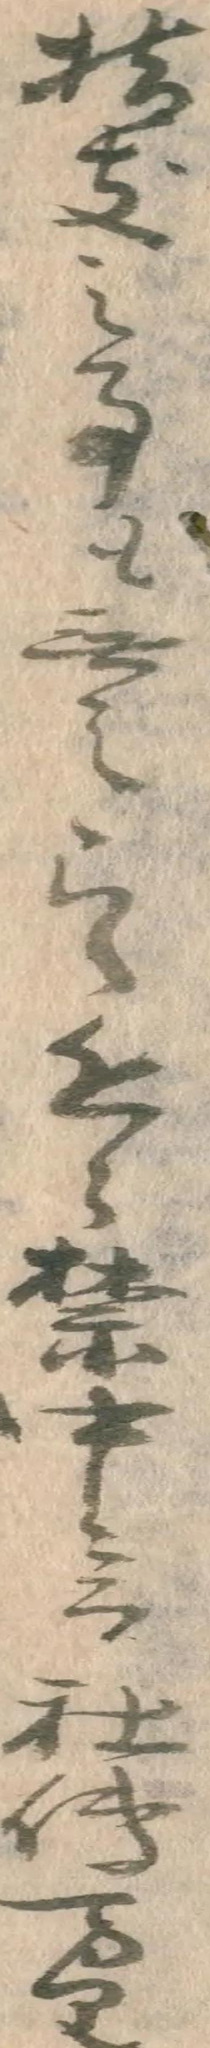指支之事も無之候ハヽ、近々禁中ニ而社傳万里
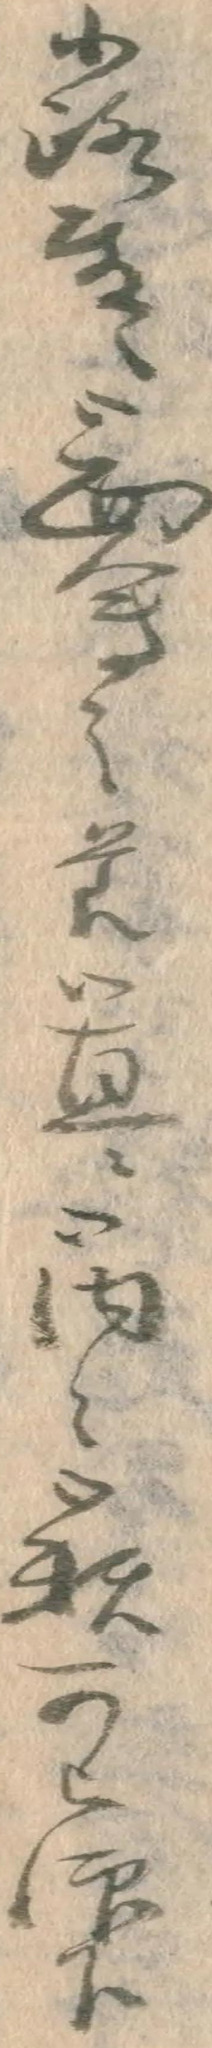小路殿へ御面会之節、御直ニ御内々御頼可被仰下
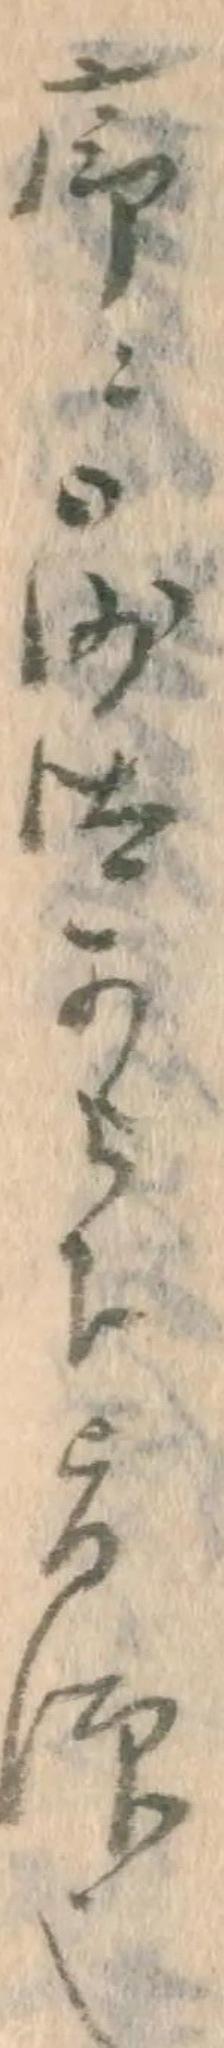序ニ御沙汰可被下旨仰也、
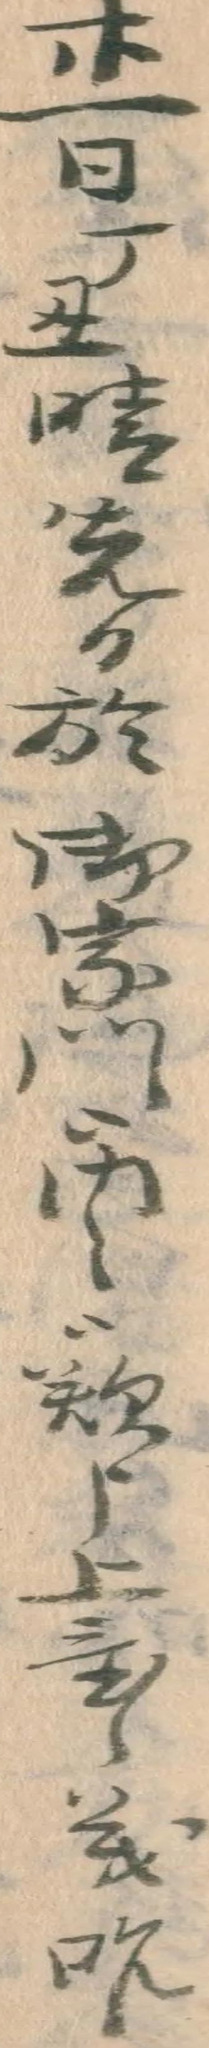廿一日丁丑晴、先日於御家門御内々ハ歎申上置候義、昨
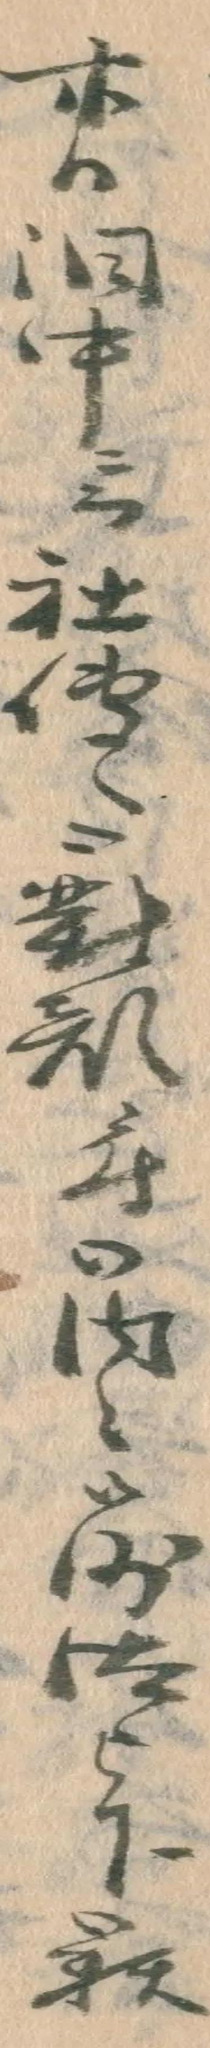廿日洞中ニ而社傳へ御對顔ニ付、御内々御沙汰被下、御秋
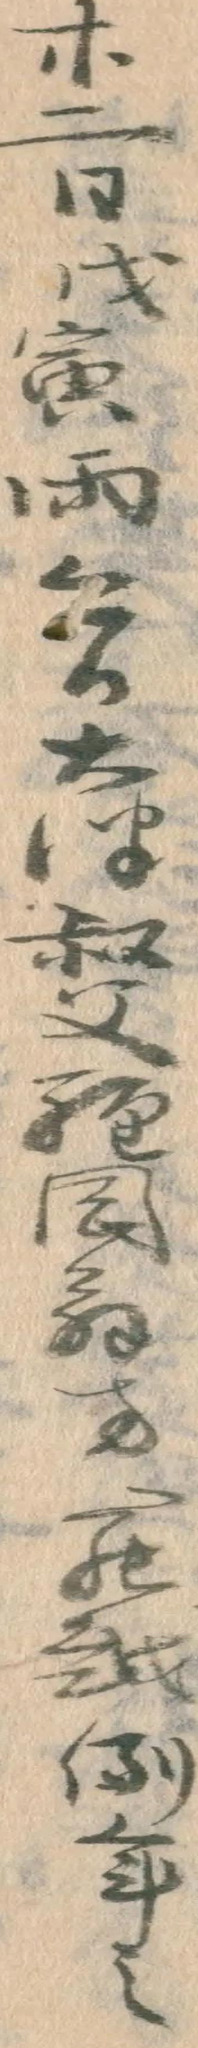廿二日戊寅雨、今日大津叔父経国翁方へ罷越、例年之
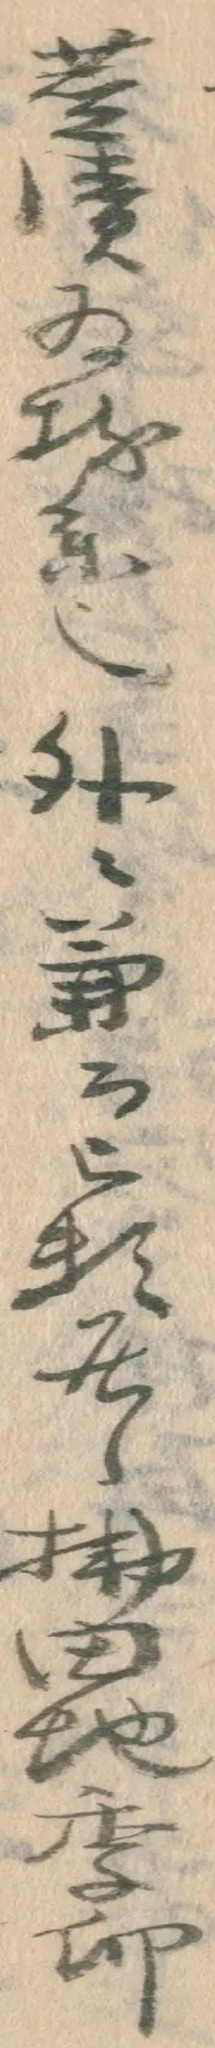芝漬為持参也、外ニ兼而被頼居候拂田地、季卯
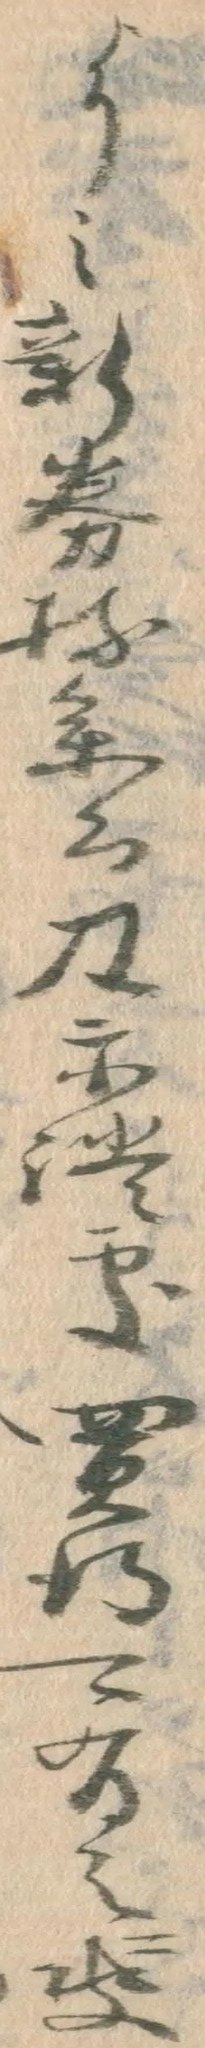より之新券持参而、及示談處、買得可有之ニ決、
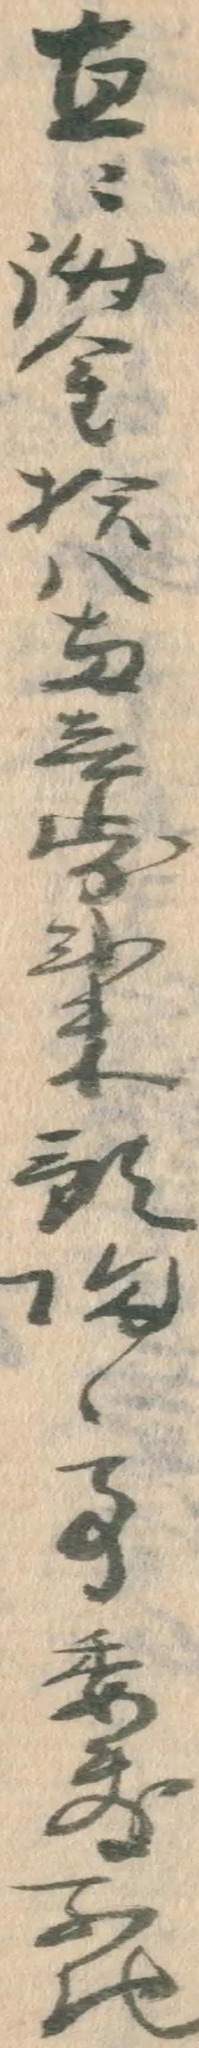直二附金拾八両壱斗弐升預帰候事、委敷不知、
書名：賀茂社記録. 第63冊
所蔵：国立国会図書館 National Diet Library, JAPAN
